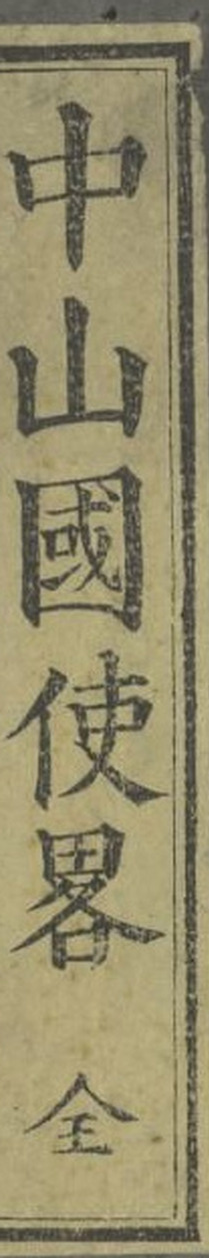中山国使略全

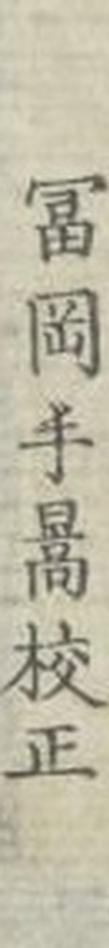冨岡手暠校正
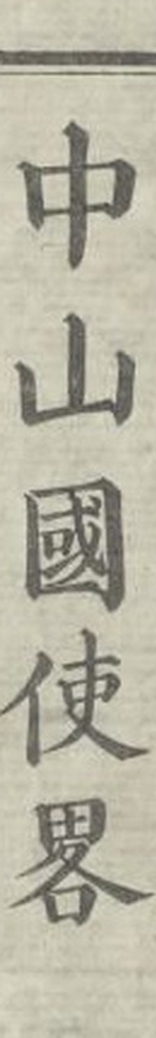中山国使略
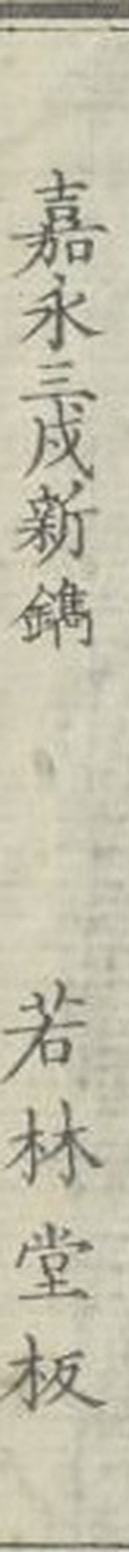嘉永三戌新鐫若林堂板
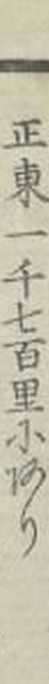正東一千七百里にあり
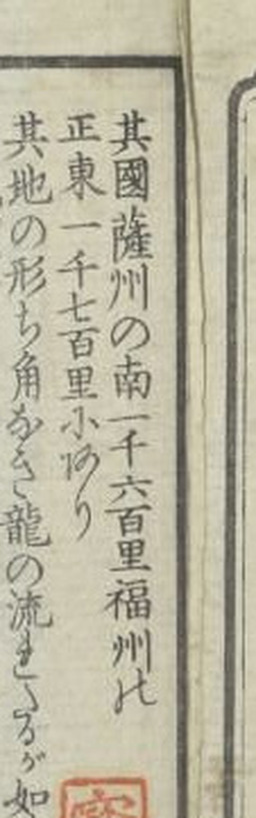其国薩州の南一千六百里福州の
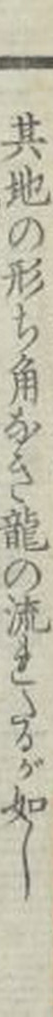其地の形ち角なき龍の流れたるが如し
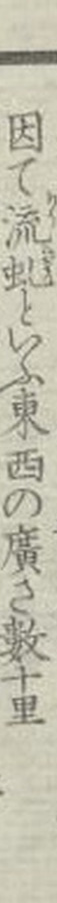因て流虬といふ東西の広さ数十里
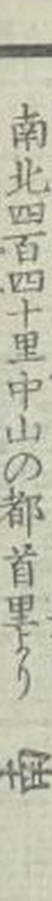南北四百四十里中山の都首里より
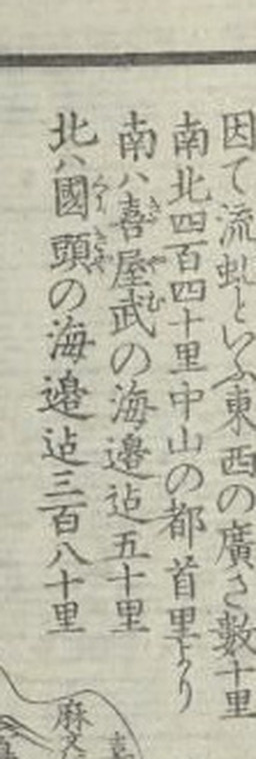南ハ喜屋武の海辺迠五十里
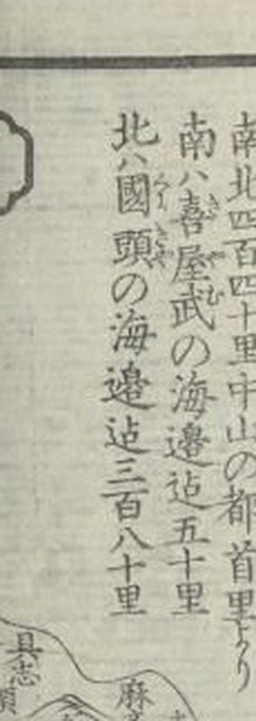北ハ国頭の海辺迠三百八十里
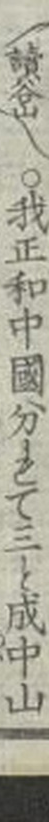○我正和中国分れて三と成中山
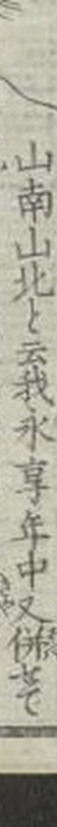山南山北と云我永享年中又併せて
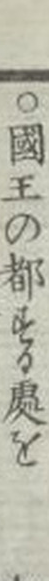○国王の都する処を
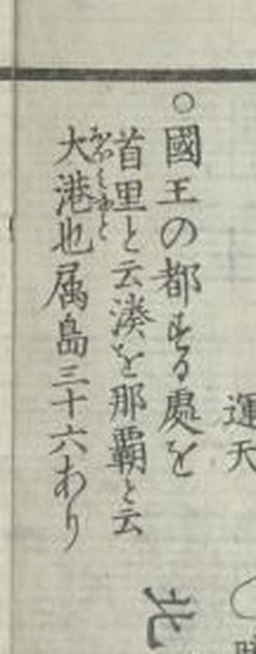首里と云湊を那覇と云
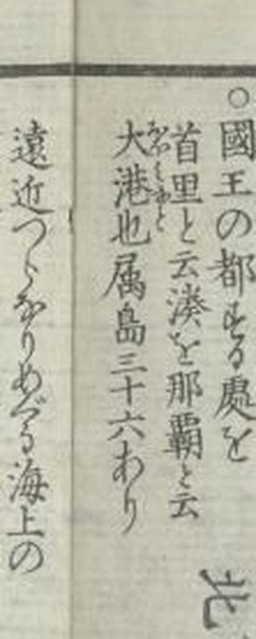大港也属島三十六あり
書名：中山国使略
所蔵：University of the Ryukyus Library
